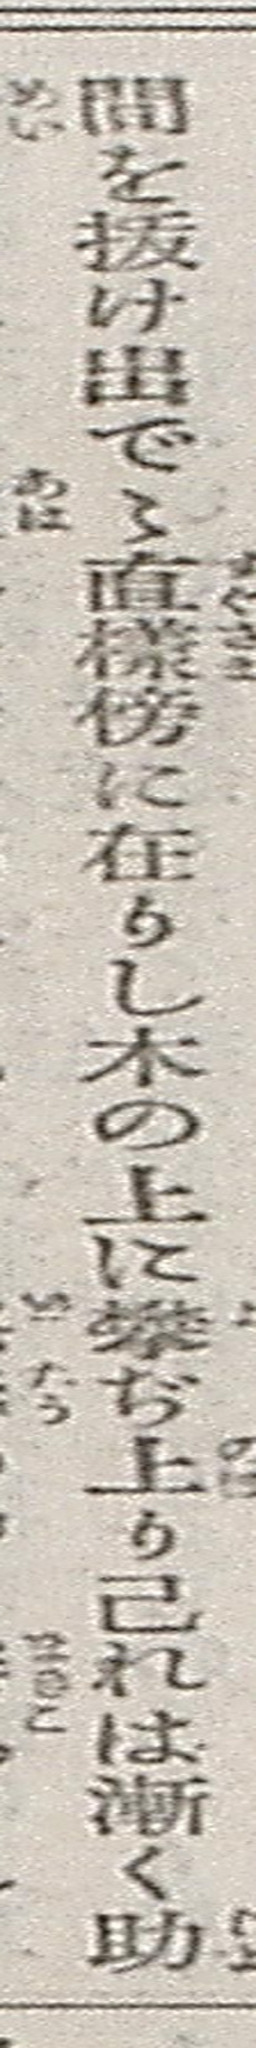間を抜け出で〻直様傍に在りし木の上に攀ぢ上り己れは漸く助
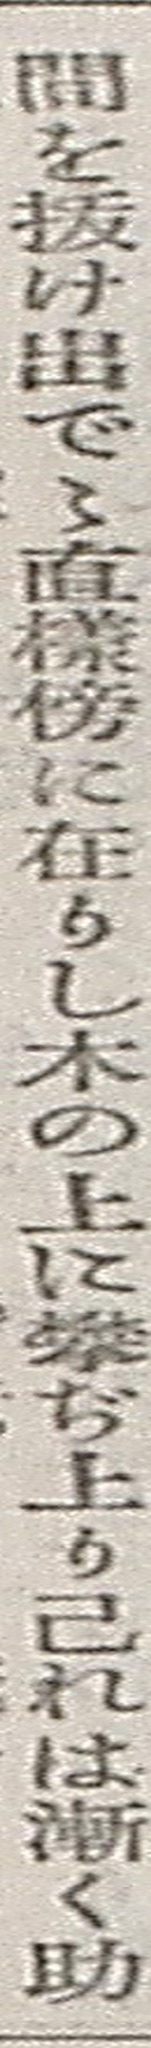間を抜け出で〻直様傍に在りし木の上に攀ぢ上り己れは漸く助
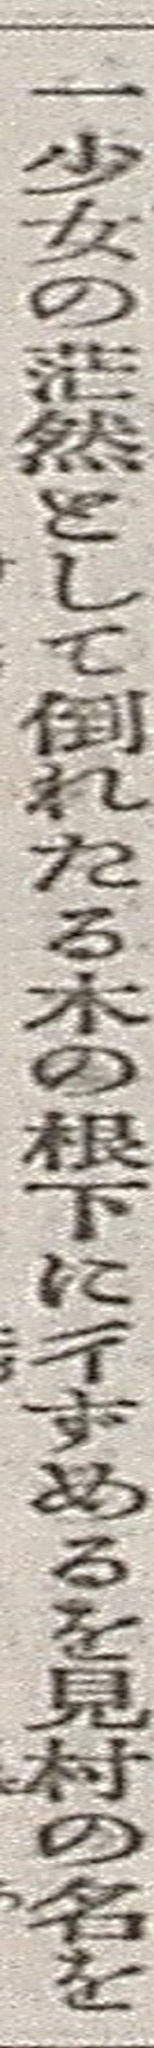一少女の茫然として倒れたる木の根下に彳ずめるを見村の名を
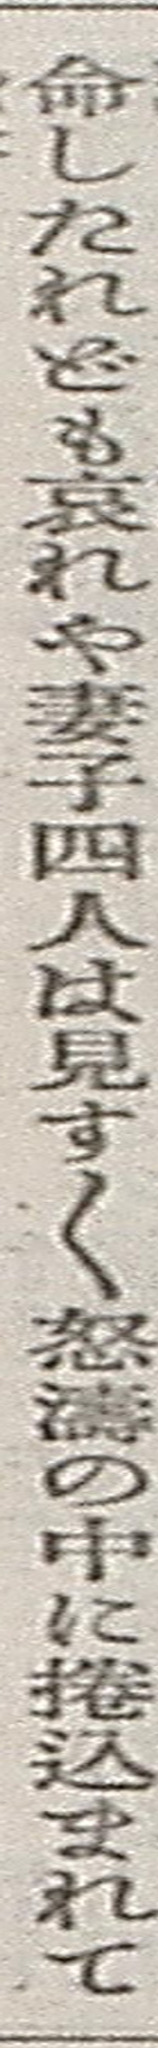命したれども哀れや妻子四人は見す〳〵怒涛の中に巻込まれて
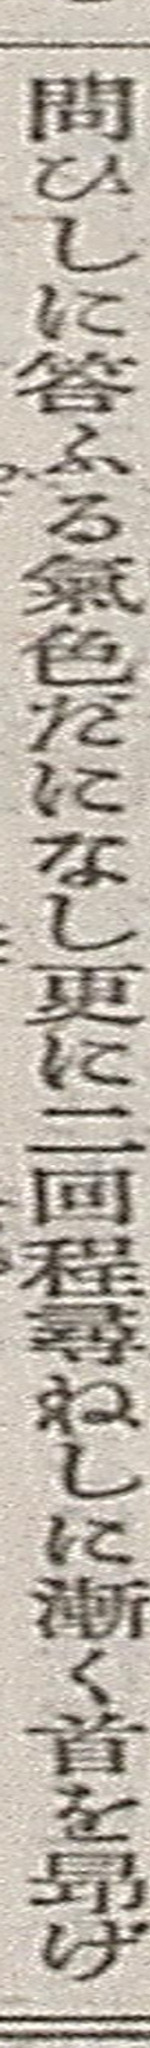問ひしに答ふる気色だになし更に二回程尋ねしに漸く首を昂げ
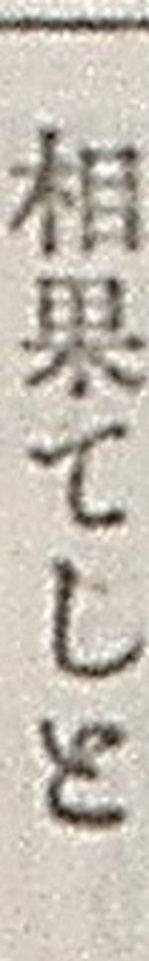相果てしと
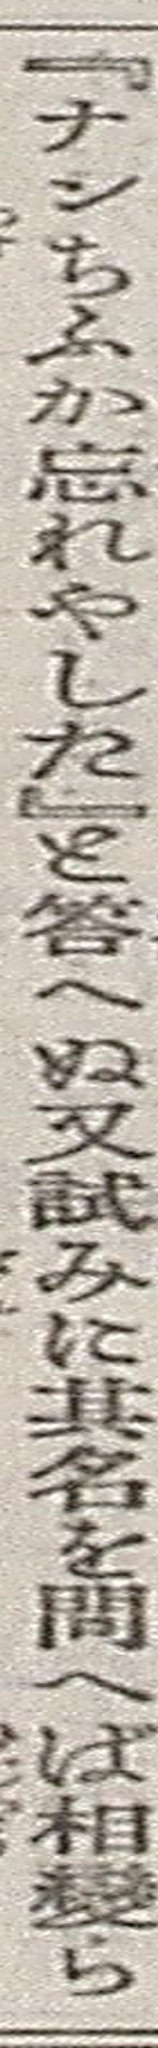「ナンちふか忘れやした」と答へぬ又試みに其名を問へば相変ら
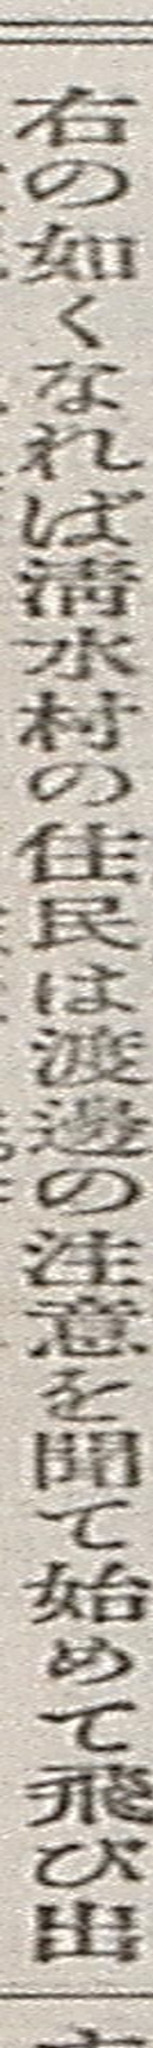右の如くなれば清水村の住民は渡邊の注意を聞て始めて飛び出
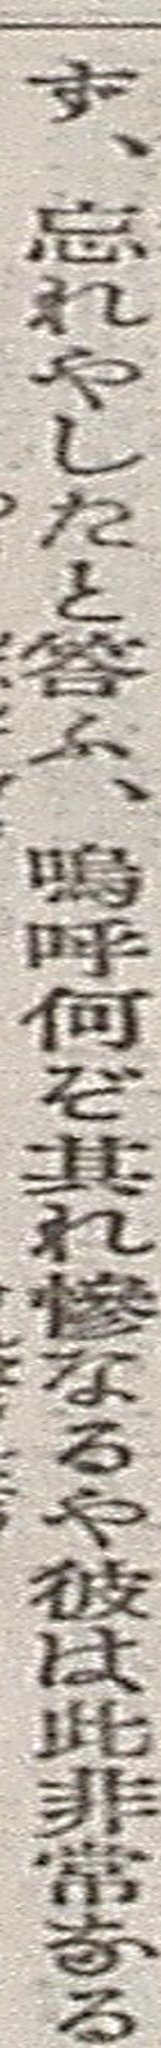ず、忘れやしたと答ふ、嗚呼何ぞ其れ惨なるや彼は此非常なる
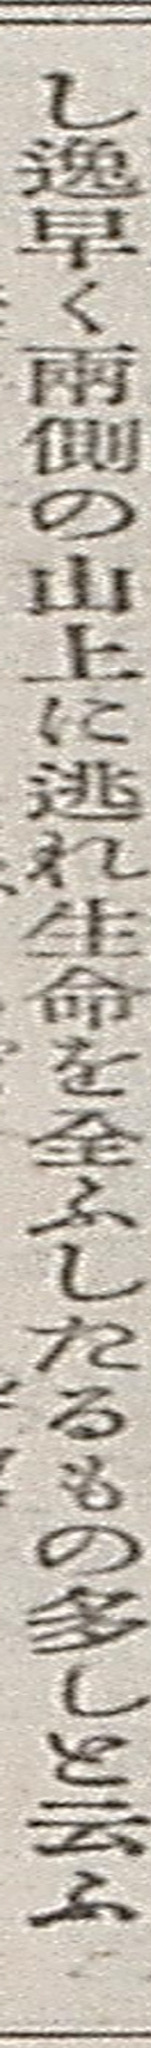し逸早く両側の山上に逃れ生命を全ふしたるもの多しと云ふ
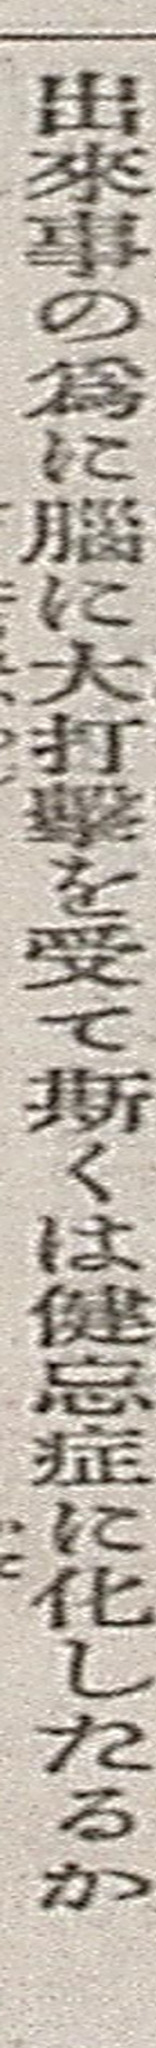出来事の為に脳に大打撃を受て斯くは健忘症に化したるか
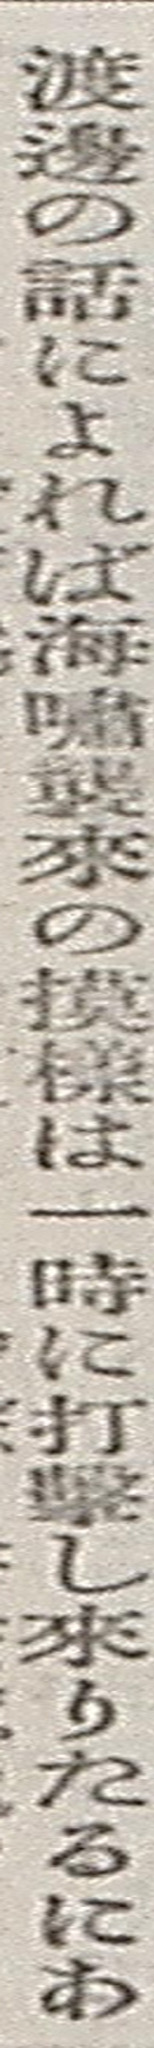渡邊の話によれば海嘯襲来の模様は一時に打撃し来りたるにあ
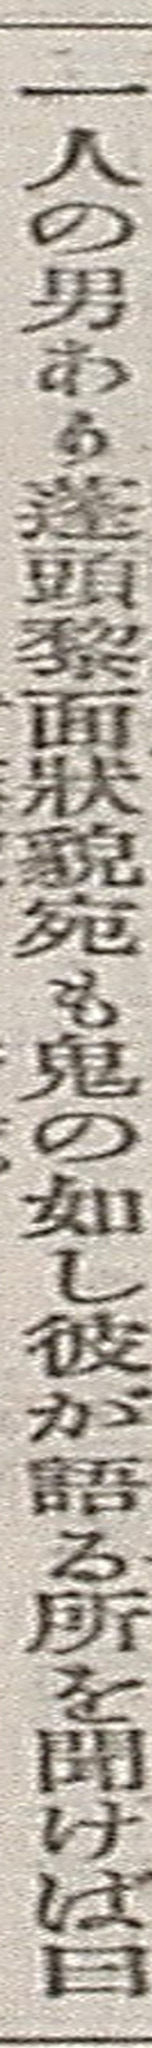一人の男あり蓬頭黎面状貌宛も鬼の如し彼が語る所を聞けば曰
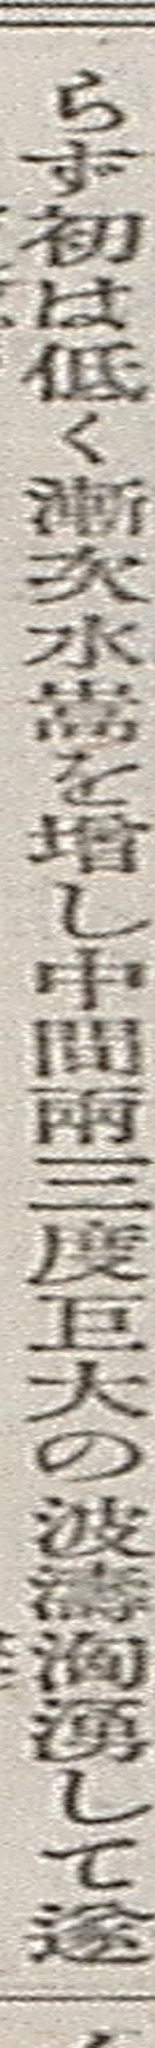らず初は低く漸次水嵩を増し中間両三度巨大の波涛洶湧して遂
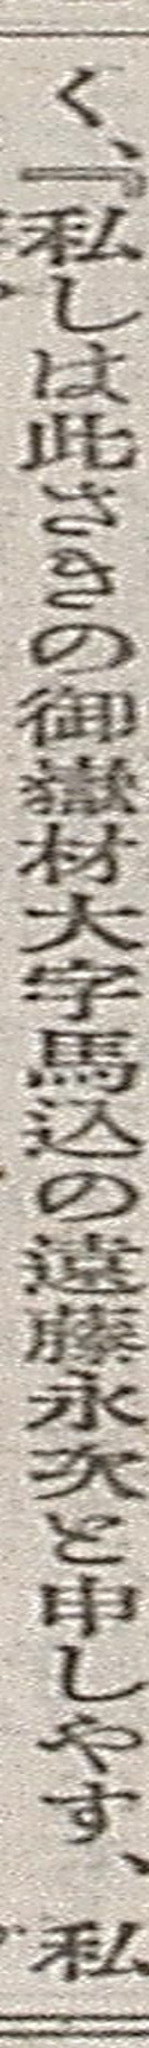く、「私しは此さきの御嶽村大字馬込の遠藤永次と申しやす、私
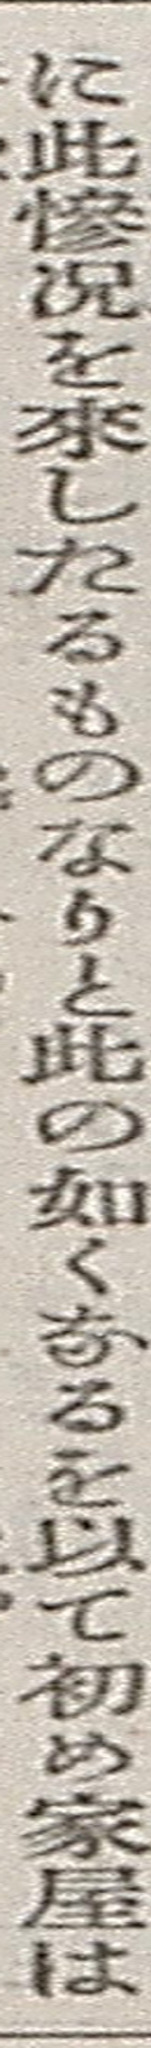に此惨況を来したるものなりと此の如くなるを以て初め家屋は
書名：風俗畫報臨時増刊第百十九號　大海嘯被害録（中）
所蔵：東京大学地震研究所図書室 Earthquake Research Institute Library, The University of Tokyo, JAPAN
